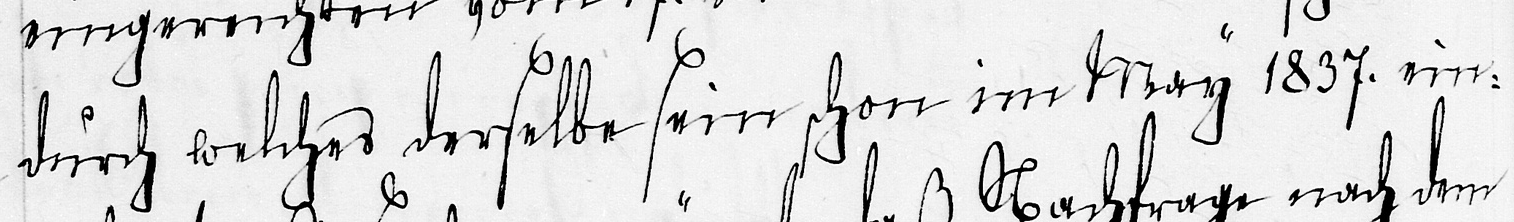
durch welches derselbe sein schon im März 1837. ein¬
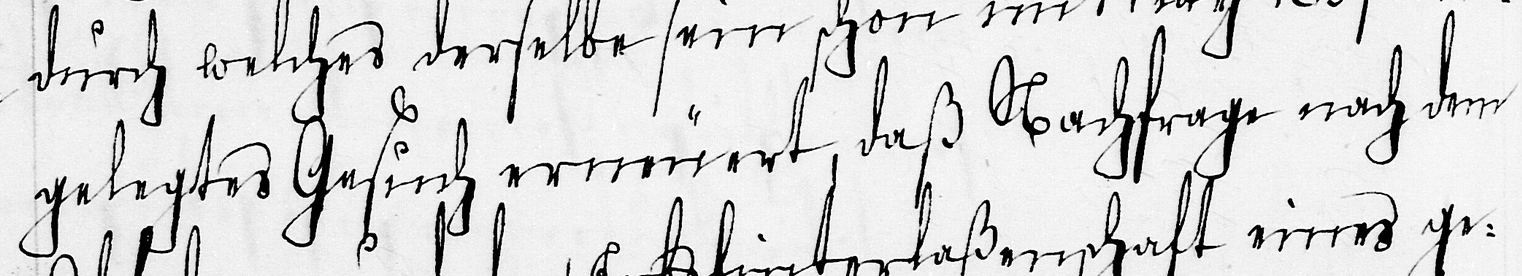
gelegtes Gesuch erneuert, daß Nachfrage nach dem
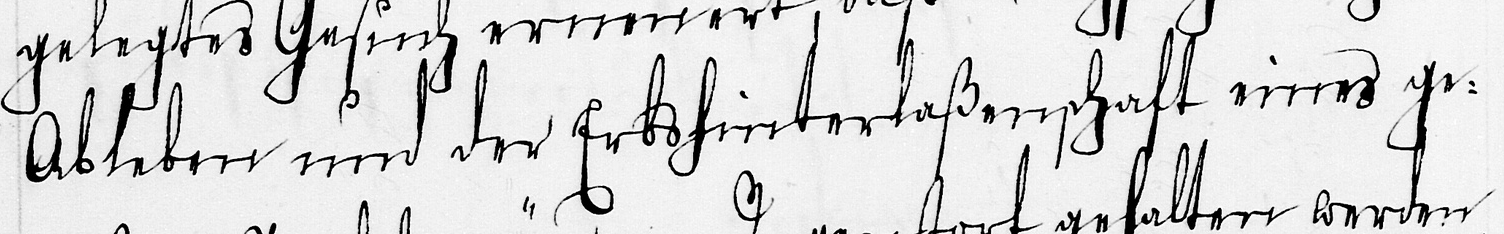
Ableben und der Erbshinterlaßenschaft eines ge¬
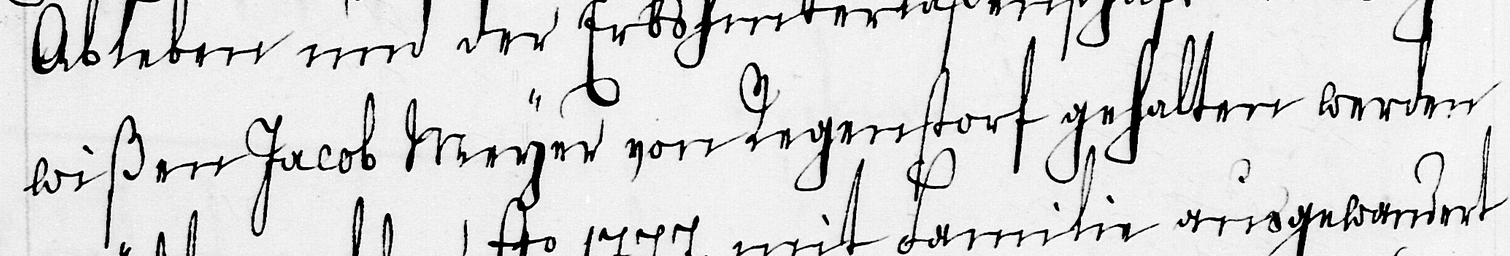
wißen Jacob Meyer von Regenstorf gehalten werden
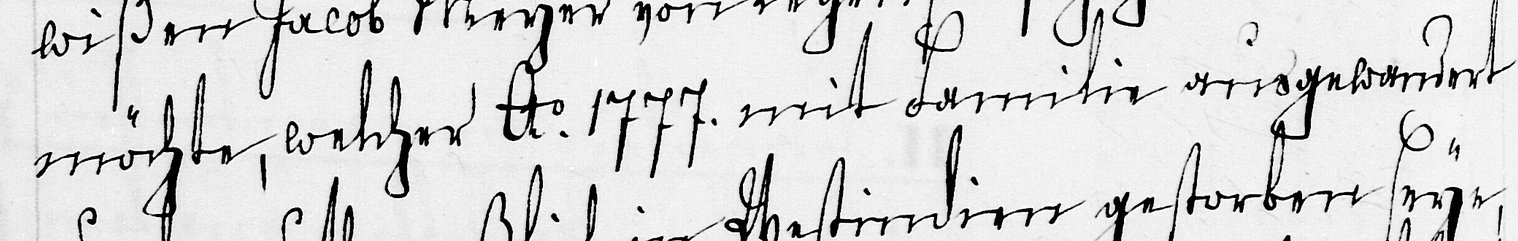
möchte, welcher A°. 1777. mit Familie ausgewandert
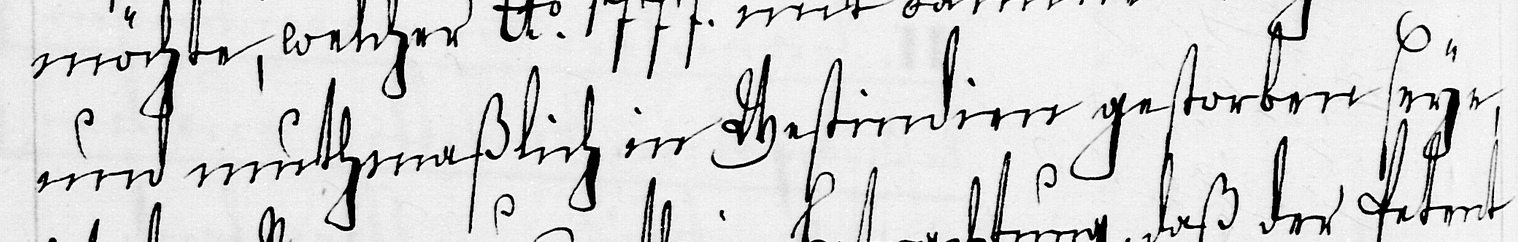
und muthmaßlich in Westindien gestorben seye,
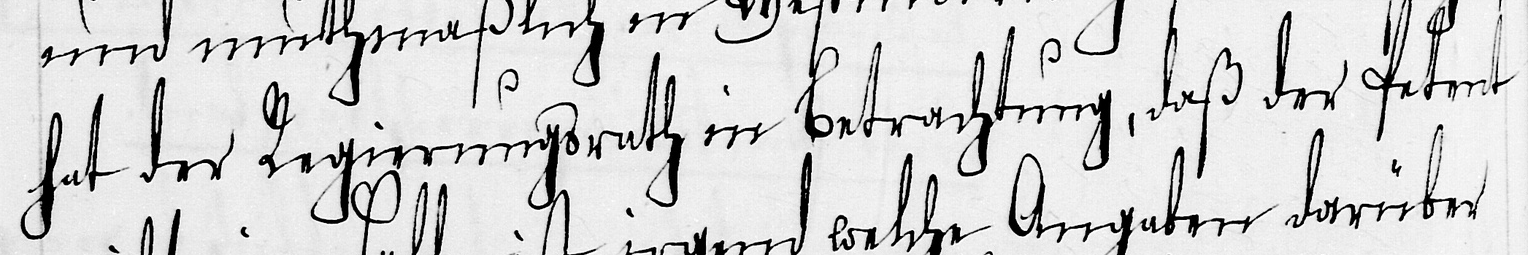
hat der Regierungsrath in Betrachtung, daß der Petent
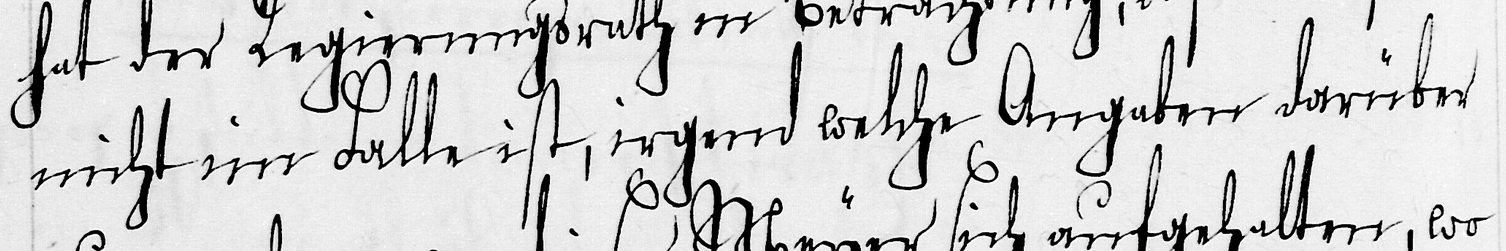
nicht im Falle ist, irgend welche Angaben darüber
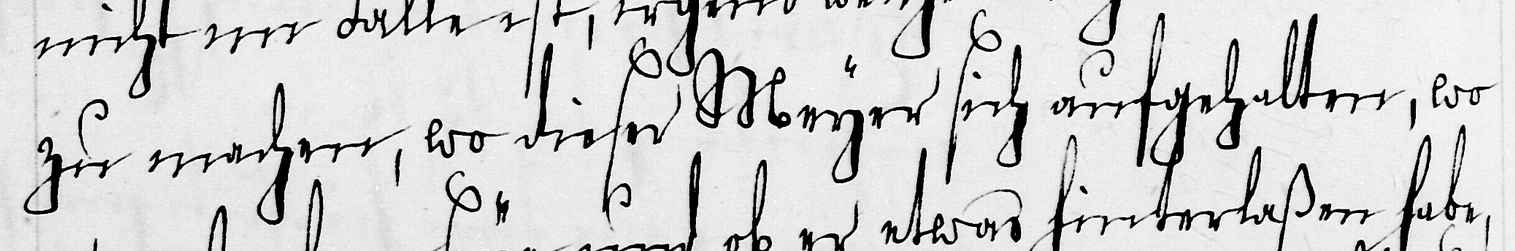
zu machen, wo dieser Meyer sich aufgehalten, wo
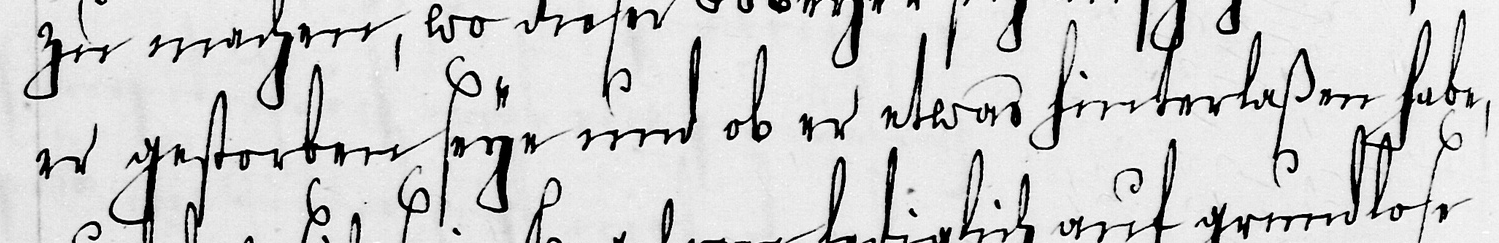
er gestorben seye und ob er etwas hinterlaßen habe,
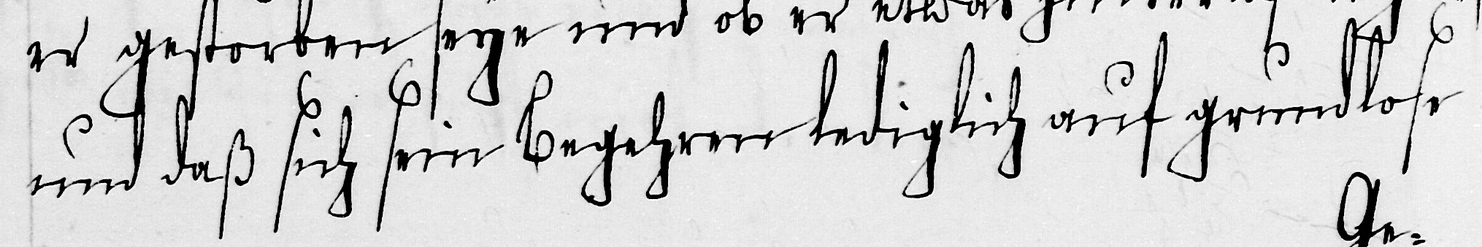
und daß sich sein Begehren lediglich auf grundlose
